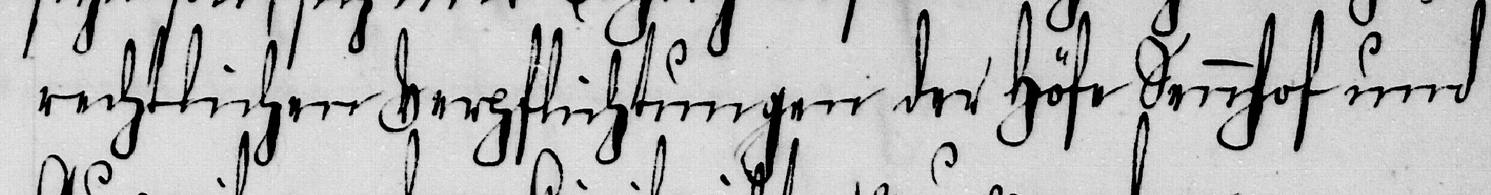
rechtlichen Verpflichtungen der Höfe Sennhof und
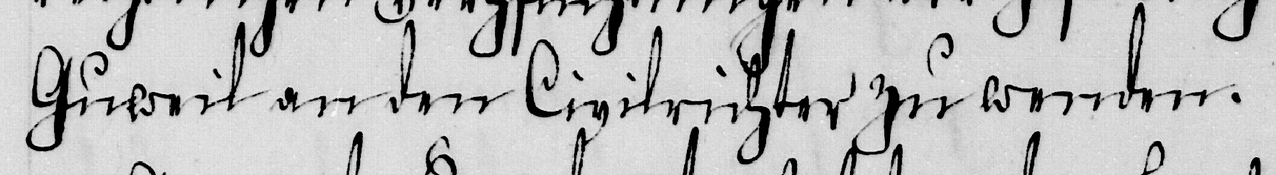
Guweil an den Civilrichter zu wenden.
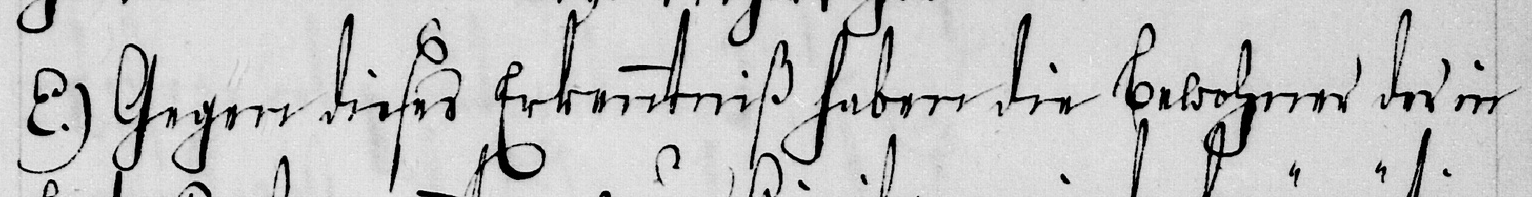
E.) Gegen dieses Erkenntniß haben die Bewohner der in
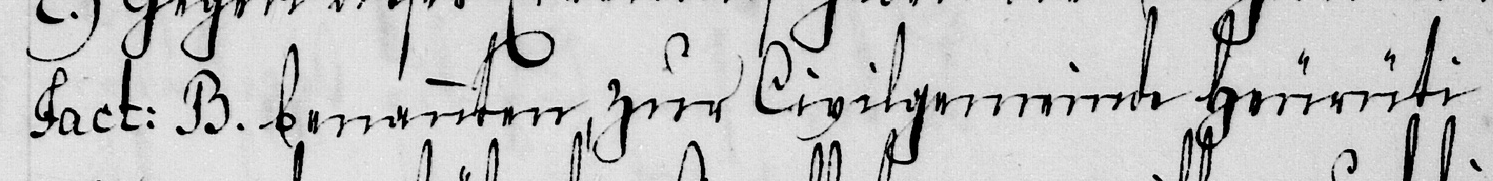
Fact: B. benannten, zur Civilgemeinde Heurüti
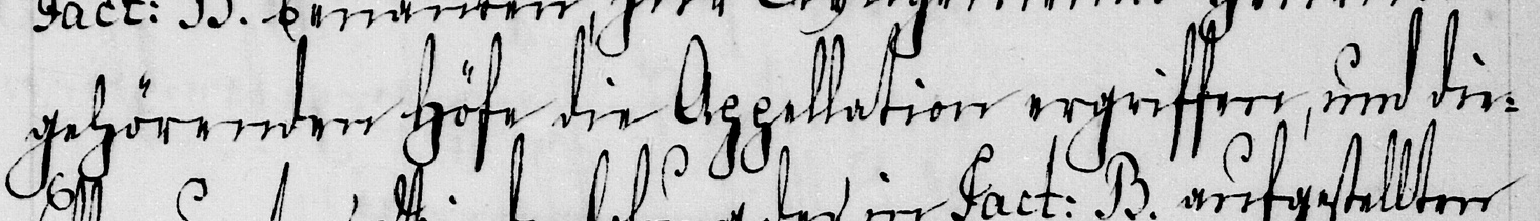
gehörenden Höfe die Appellation ergriffen, und die¬
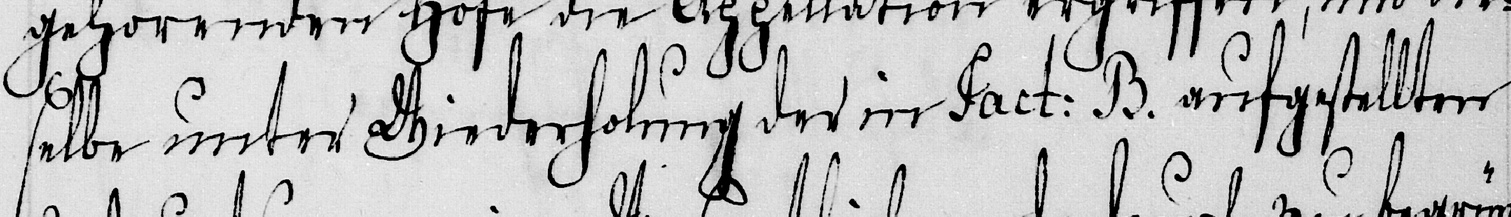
selbe unter Wiederholung der in Fact: B. aufgestellten
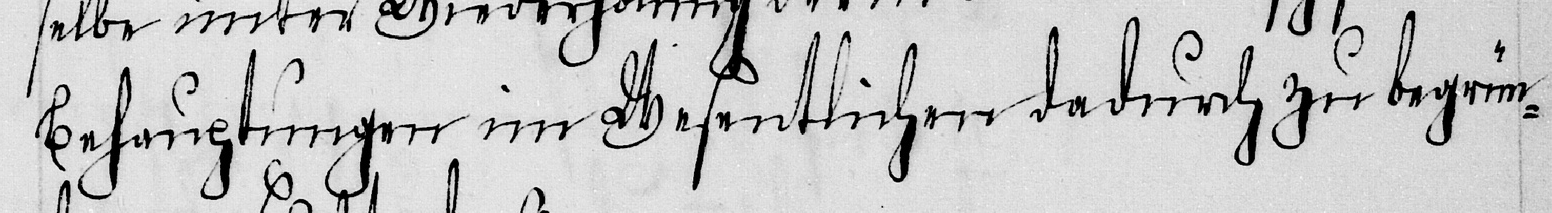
Behauptungen im Wesentlichen dadurch zu begrün¬
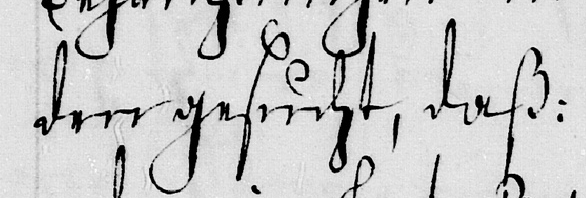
den gesucht, daß:
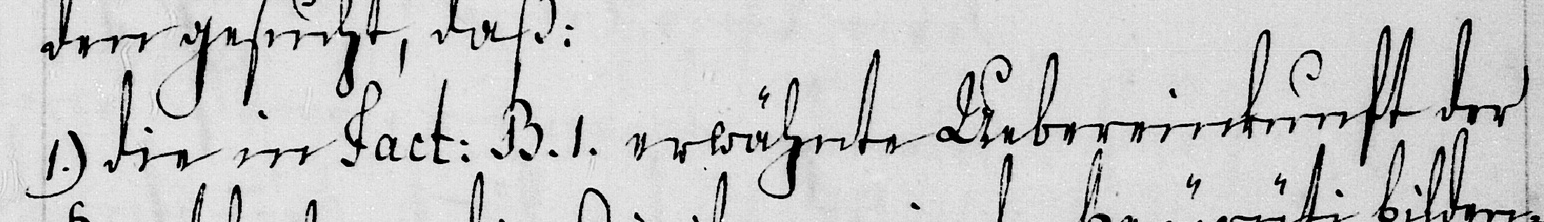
1.) die in Fact: B. 1. erwähnte Uebereinkunft der
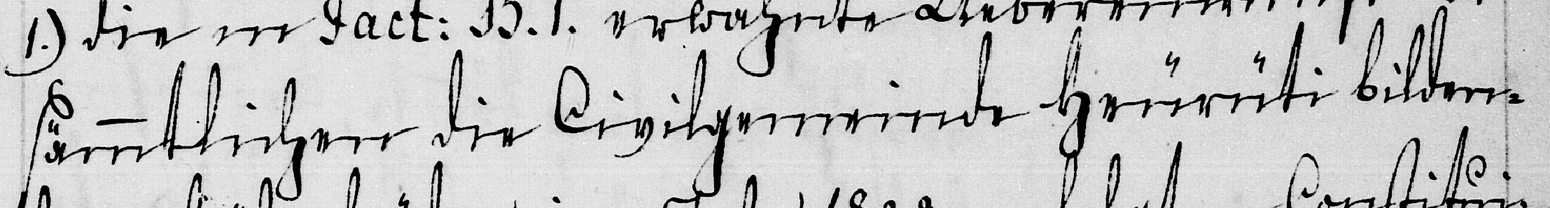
sämmtlichen die Civilgemeinde Heurüti bilden¬
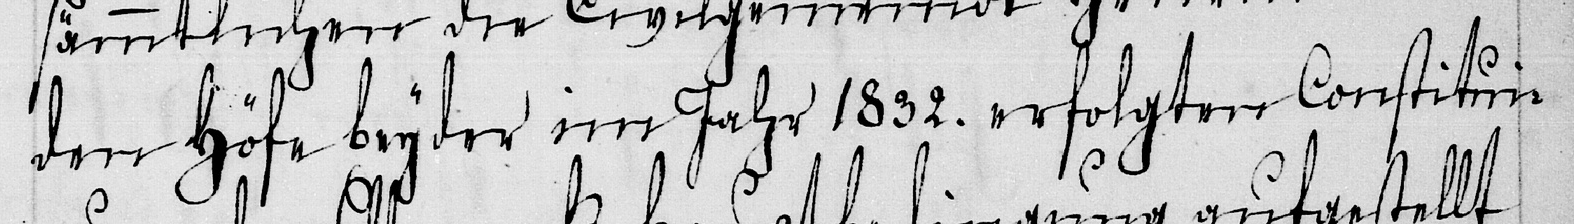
den Höfe bey der im Jahr 1832. erfolgten Constitui¬
